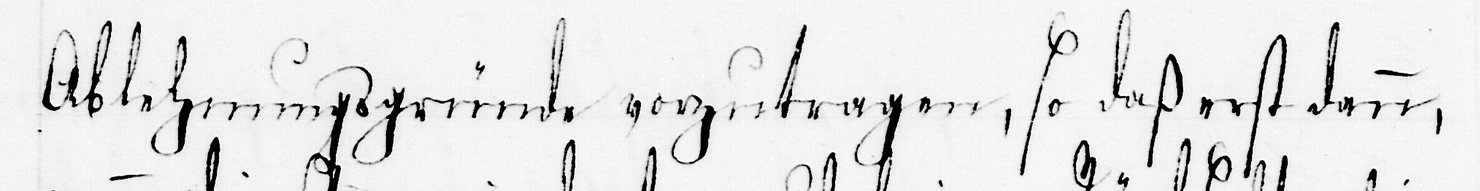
Ablehnungsgründe vorzutragen, so daß erst dann,
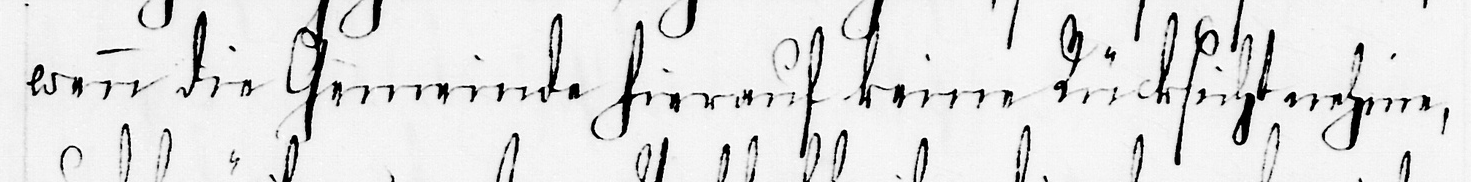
wenn die Gemeinde hierauf keine Rücksicht nehme,
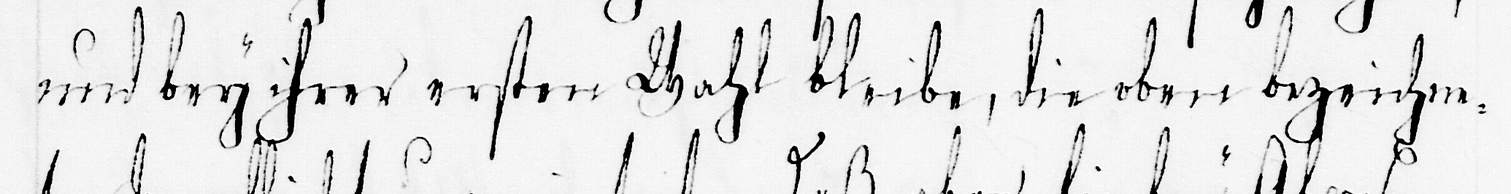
und bey ihrer ersten Wahl bleibe, die oben bezeichne¬
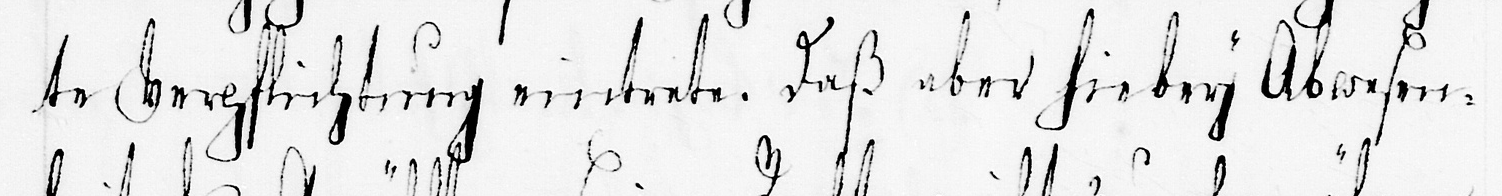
te Verpflichtung eintrete. Daß aber hiebey Abwesen¬
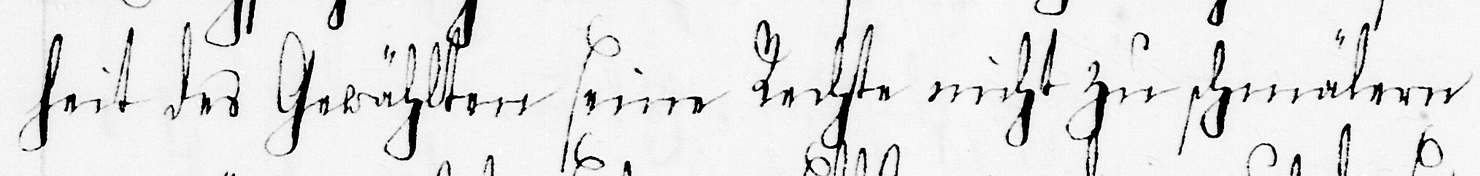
heit des Gewählten seine Rechte nicht zu schmälern
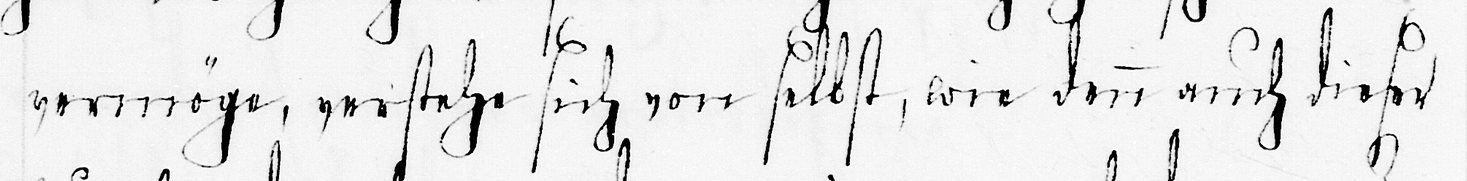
vermöge, verstehe sich von selbst, wie denn auch dieser
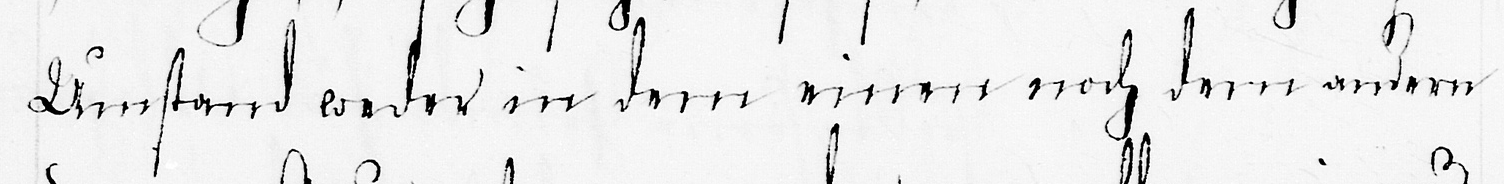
Umstand weder in dem einen noch dem andern
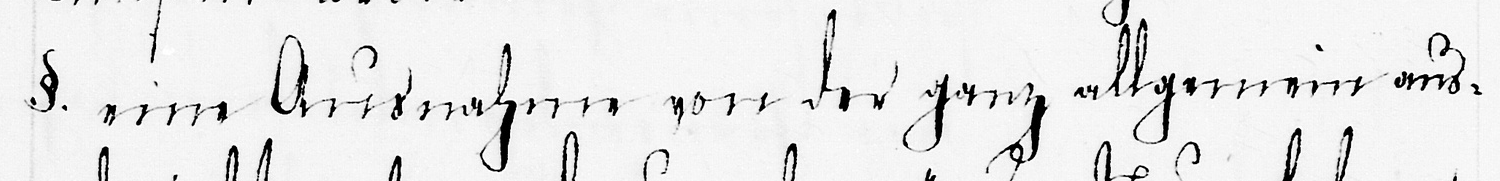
§. eine Ausnahme von der ganz allgemein aus¬
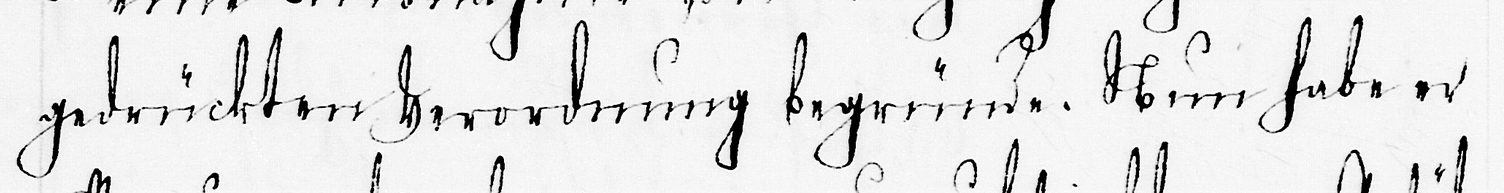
gedrückten Verordnung begründe. Nun habe er
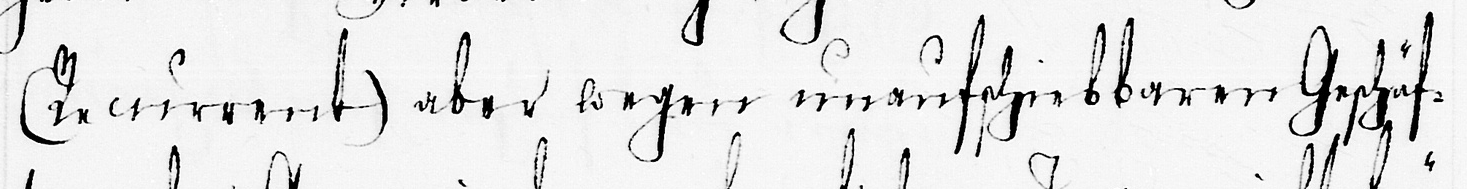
(Recurrent) aber wegen unaufschiebbaren Geschä¬
